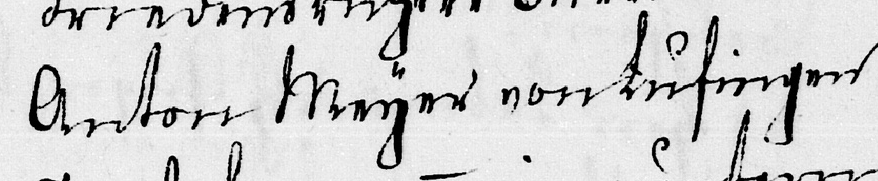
Anton Meyer von Lufingen,
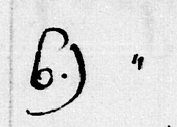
6.)
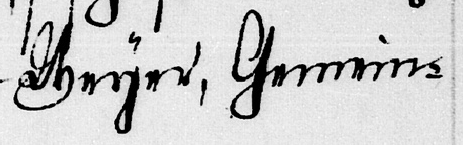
Weyer, Gemein¬
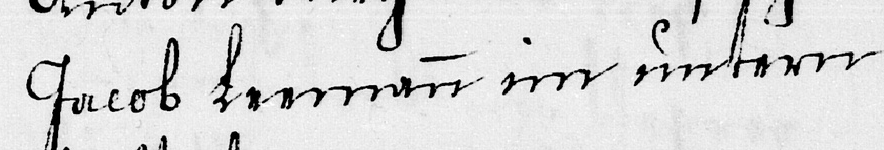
Jacob Leemann im untern
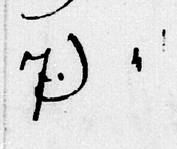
7.)
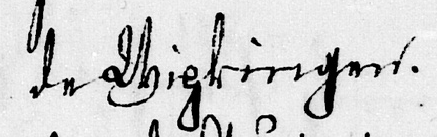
de Wipkingen.
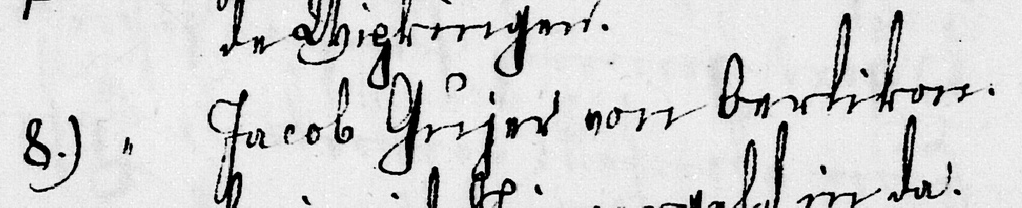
8.) “ Jacob Gujer von Oerlikon.
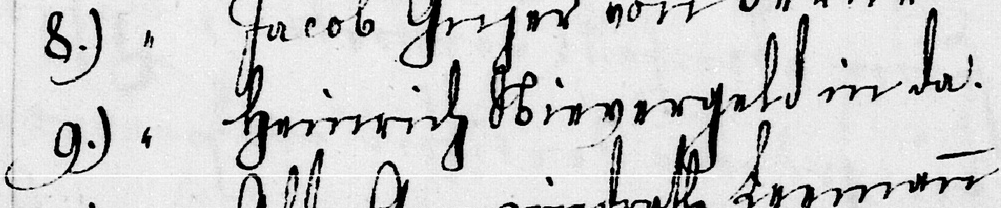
9.) “ Heinrich Nievergeld in da.
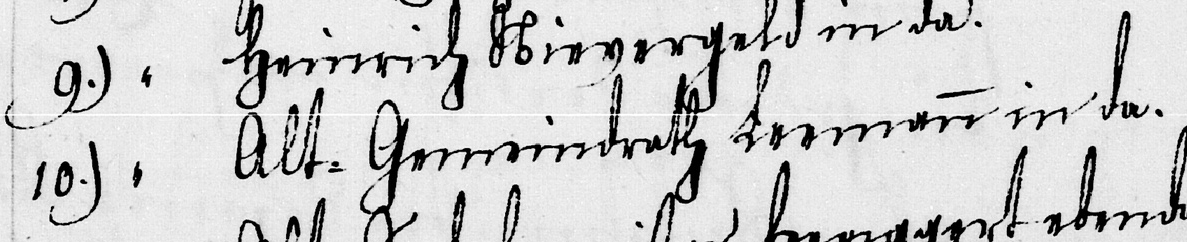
10.) “ Alt-Gemeindrath Leemann in da.
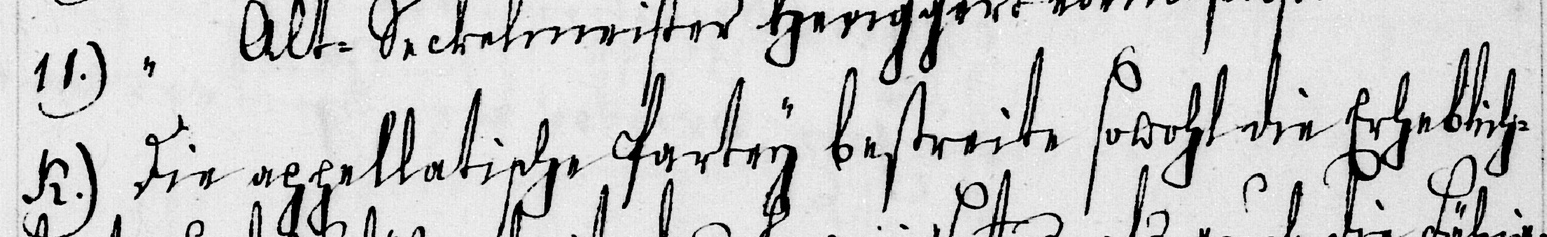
K.) Die appellatische Partey bestreite sowohl die Erheblic¬
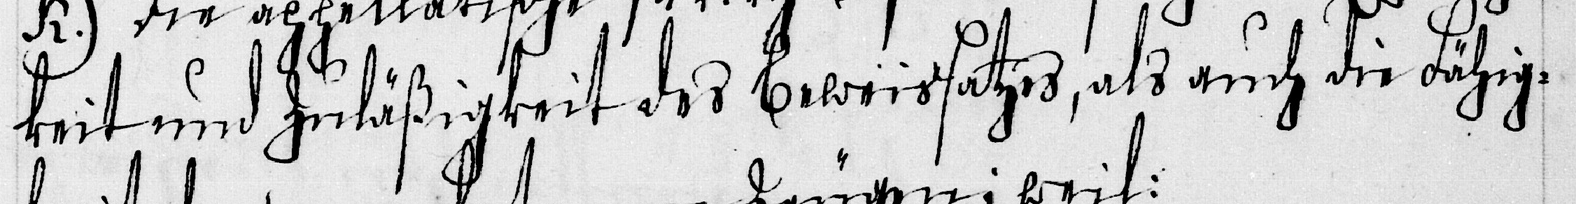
hkeit und Zuläßigkeit des Beweissatzes, als auch die Fähig¬
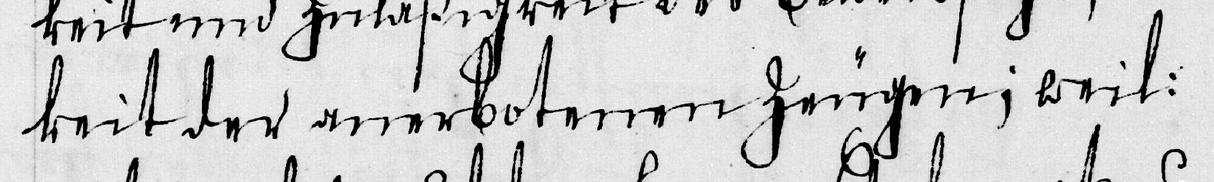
keit der anerbotenen Zeugen; weil:
